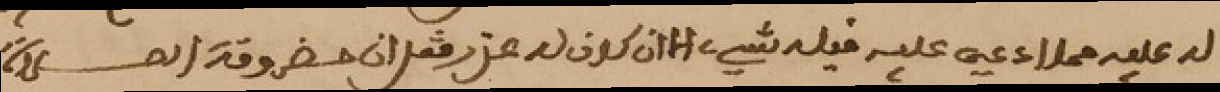له عليه مما ادعي عليه قيله شيء الا ان كون له عذر مثل ان حضر وقت الصلاة
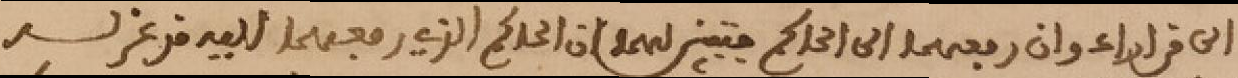الى من اراد وان رفعهما الى الحاكم فتبين لهما ان الحاكم الذي رفعهما اليه قد عزله
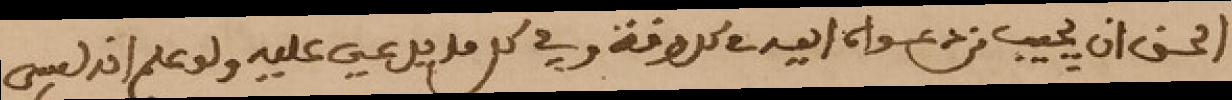الحق ان يجيب من دعواه اليه في كل وقت وفي كل ما يدعي عليه ولو علم انه ليس
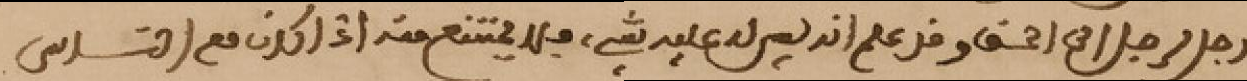رجل لرجل الى الحق وقد علم انه ليس له عليه شيء فلا يمتنع حقه اذا كان مع الناس
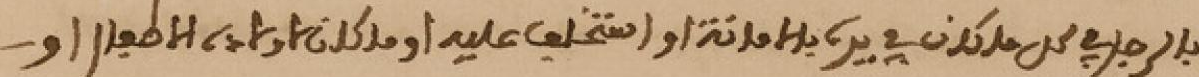بالرجل في كل ما كان في يده بالامانة او استخلف عليه او ما كان لاولاده لاطفال او
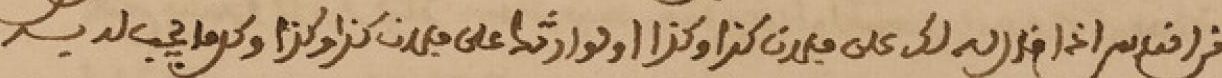من الناس اذا قال له لك على فلان كذا وكذا او لوارثها على فلان كذا زكذا وكل ما يجب لديه
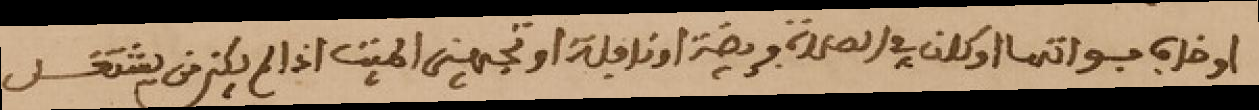او خاف فواتها او كان في الصلاة فريضة او نافلة او تجهيز الميت اذا لم يكن من يشتغل
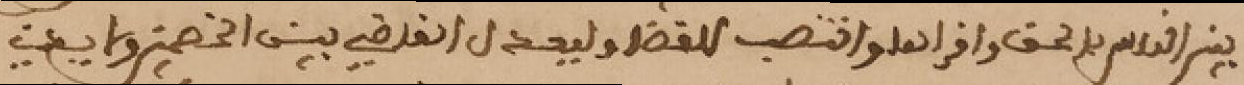بين الناس بالحق # وانتصب للقضا وليبدل القاضي بين الخصمين ولا يبين
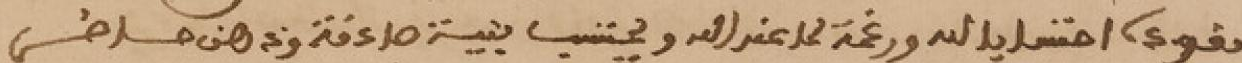مقوده احتسابا لله ورغبة لما عند الله ويحتسب بنية صادقة وذهن حاضر
